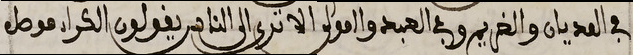في المديان والغريم وفي العبد والمولى الا ترى الى الناس يقولون الكراء موصل
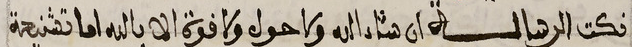نكت الرسالة ان شاء الله ولا حول ولا قوة الا بالله اما تشنيعة
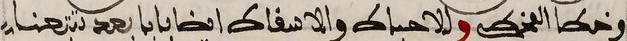وخطا المخطي والإحباط والاسقاط ايضا بابا بعد تتبعنا
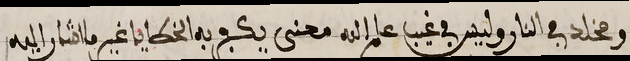ومخلد في النار وليس في غيب علم الله معنى يكفر به الخطايا غير ما أشار اليه
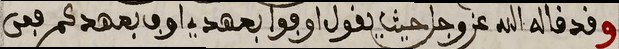وقد قاله الله عز وجل حيث يقول اوفوا بعهدي اوف بعهدكم فمن
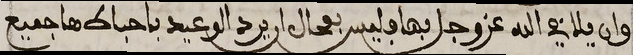وان يلاقي الله عز وجل بها فليس بمحال ان يرد الوعيد باحباطها جميع
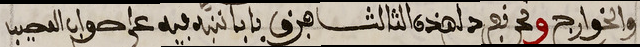والخوارج ونحن نفرد لهذه الثالث فرق بابا ننبه فيه على صواب المصيب
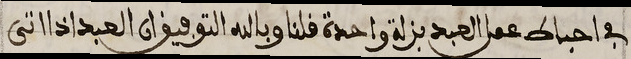في احباط عمل العبد بزلة واحدة قلنا وبالله التوفيق ان العبد اذا اتى
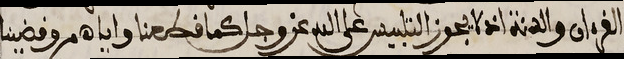القرءان والسنة اذ لا يجوز التلبيس على الله عز وجل كما قطعنا واياهم وقضينا
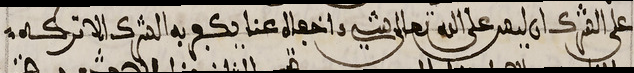على الشرك ان ليس على الله تعالى شيء اخفاه عنا يكفر به الشرك الا تركه
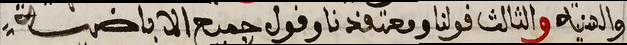والسنية والثالث قولنا ومعتقدنا وقول جميع الاباضية
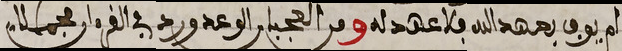لم يوف بعهد الله فلا عهد له ومن العجب ان الوعد ورد في القرءان مجملا
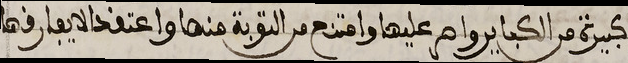كبيرة من الكباير واصر عليها وامتنع من التوبة منها واعتقد الا يفارقها
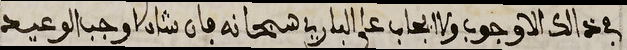في ذلك الا وجوب ولا ايجاب على الباري سبحانه فان شاء اوجب الوعيد
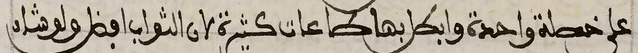على خطة واحدة وابطل بها طاعات كثيرة لان الثواب افضل ولو شاء
